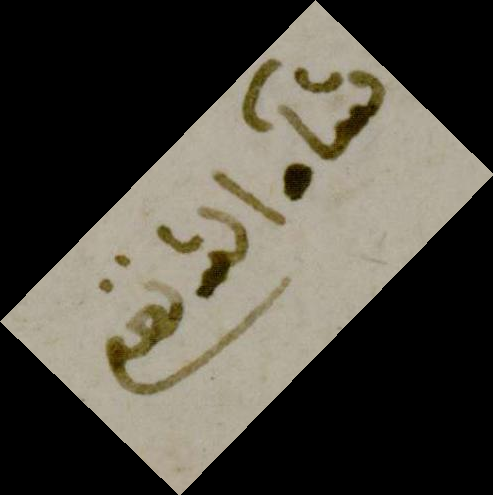شاء الله تعلى
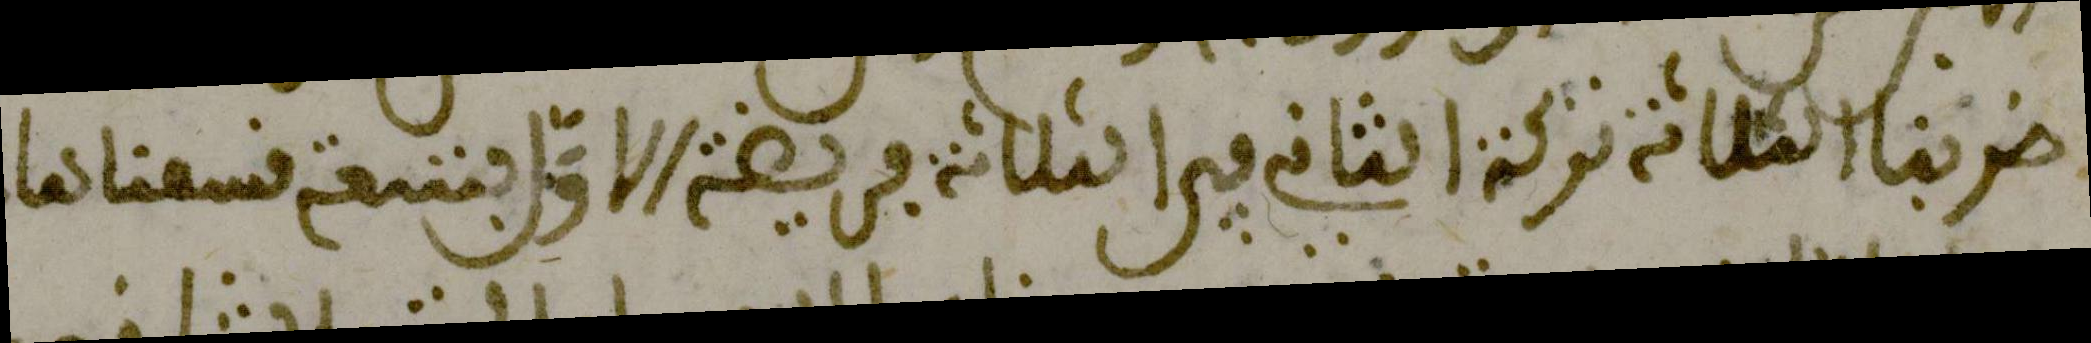ضربنا الثلاثة تركة الثاني في الثلاثة فريضة الاوّل بتسعة قسمناها
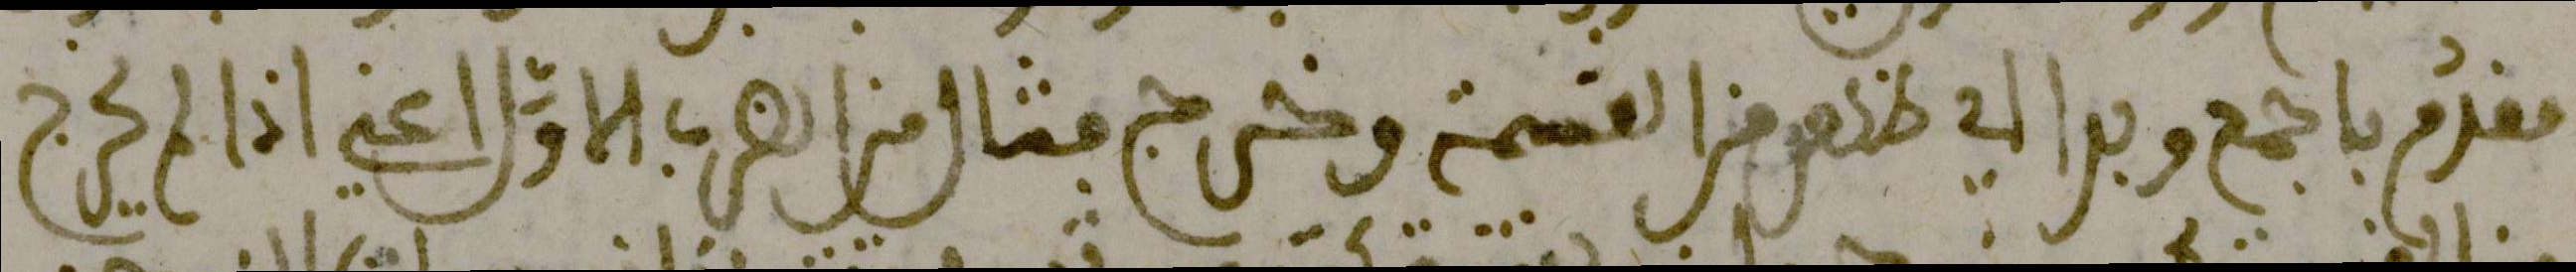مقدم باجمع وبدا اي ظهر من القسمة وخرج مثال من الضرب الاوّل اعني اذا لم يخرج
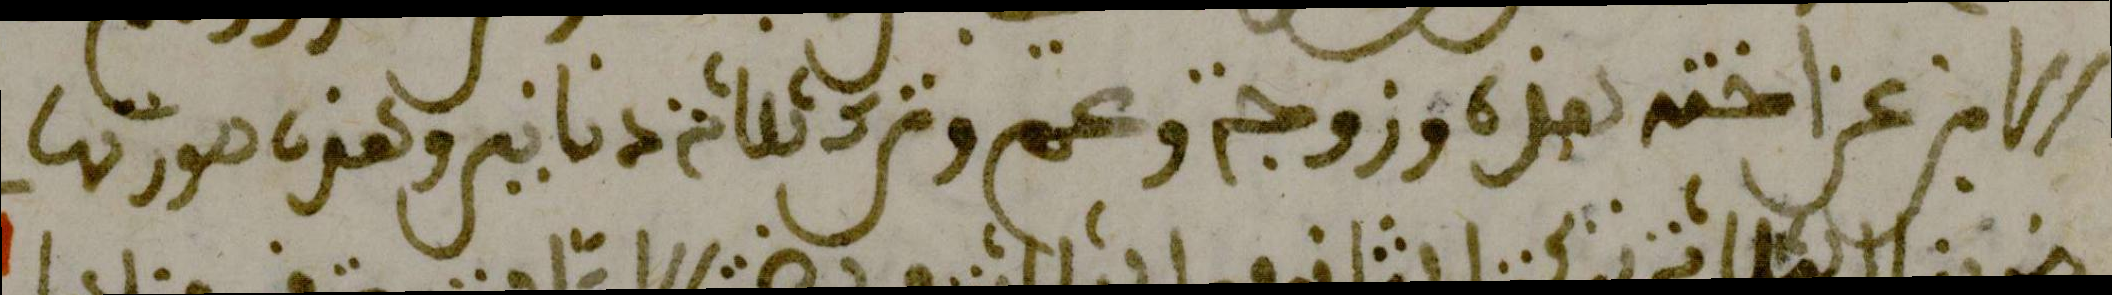الابن عن اخته هذه وزوجة وعم وترك ثلاثة دنانير وهذه صورتها
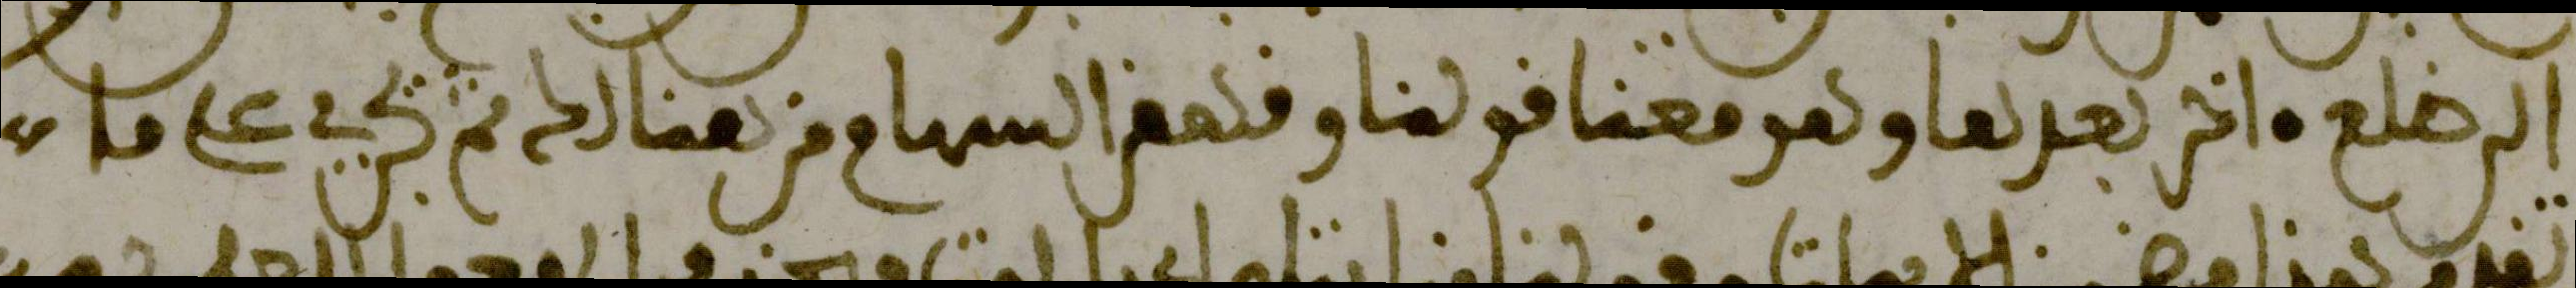الى ضلع ءاخر بعدها وهو معنا قولنا وقهقر السهام من هنالك ثم يجري على ما
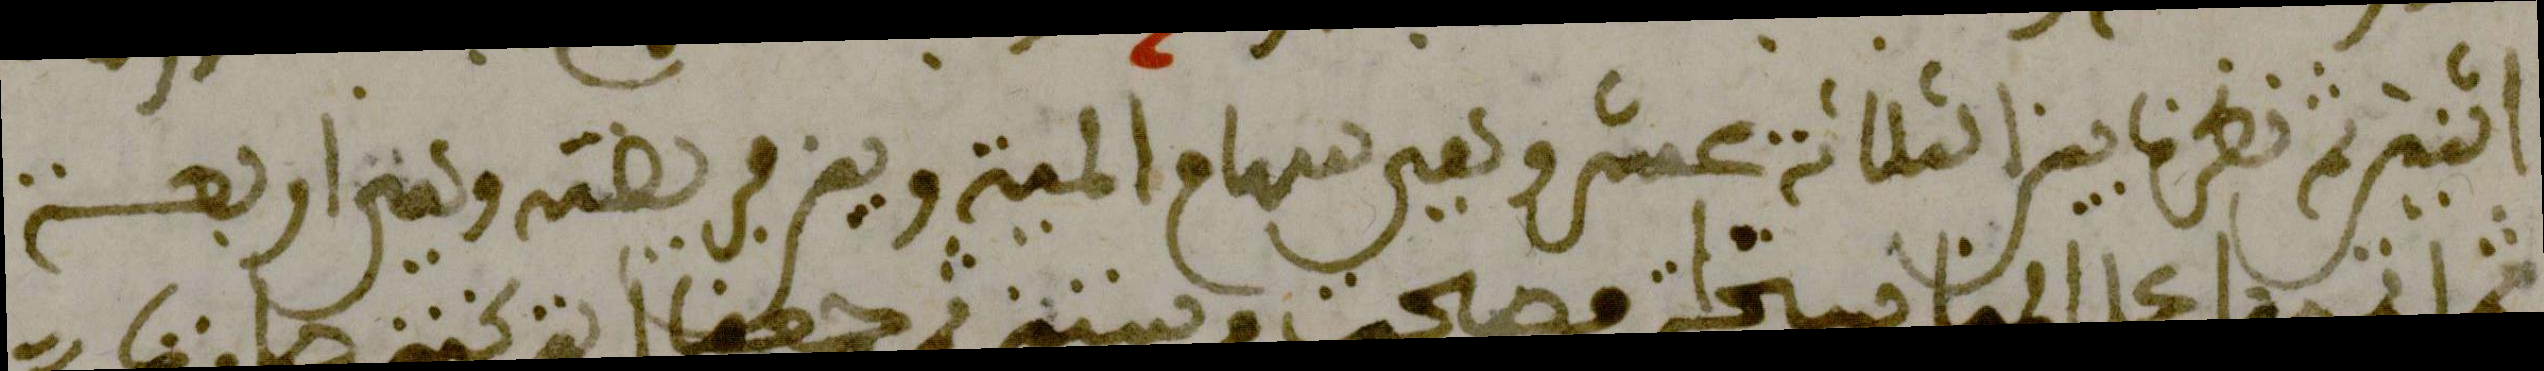اثنين ثم نظرن بين الثلاثة عشر هي سهام المية وبين فريضته وهي اربعة
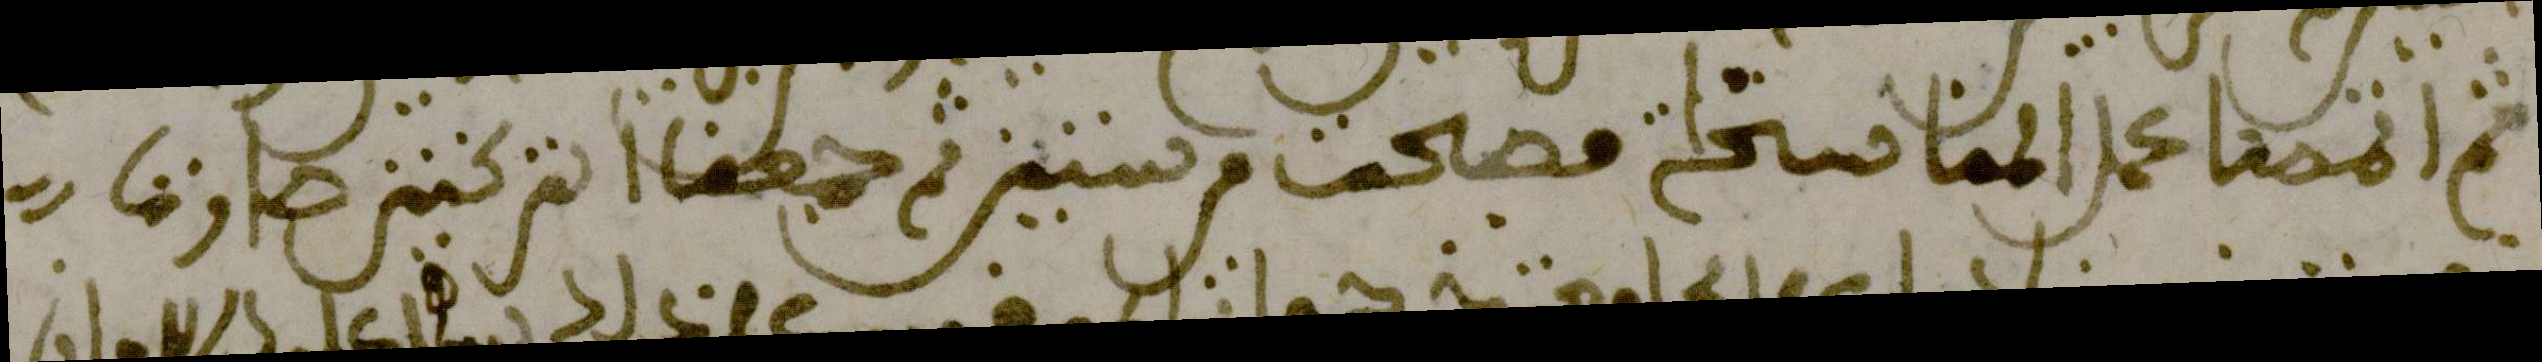ثم اتممنا عمل المناسخة فصحت من ستين ثم جمعنا التركتين صارت
